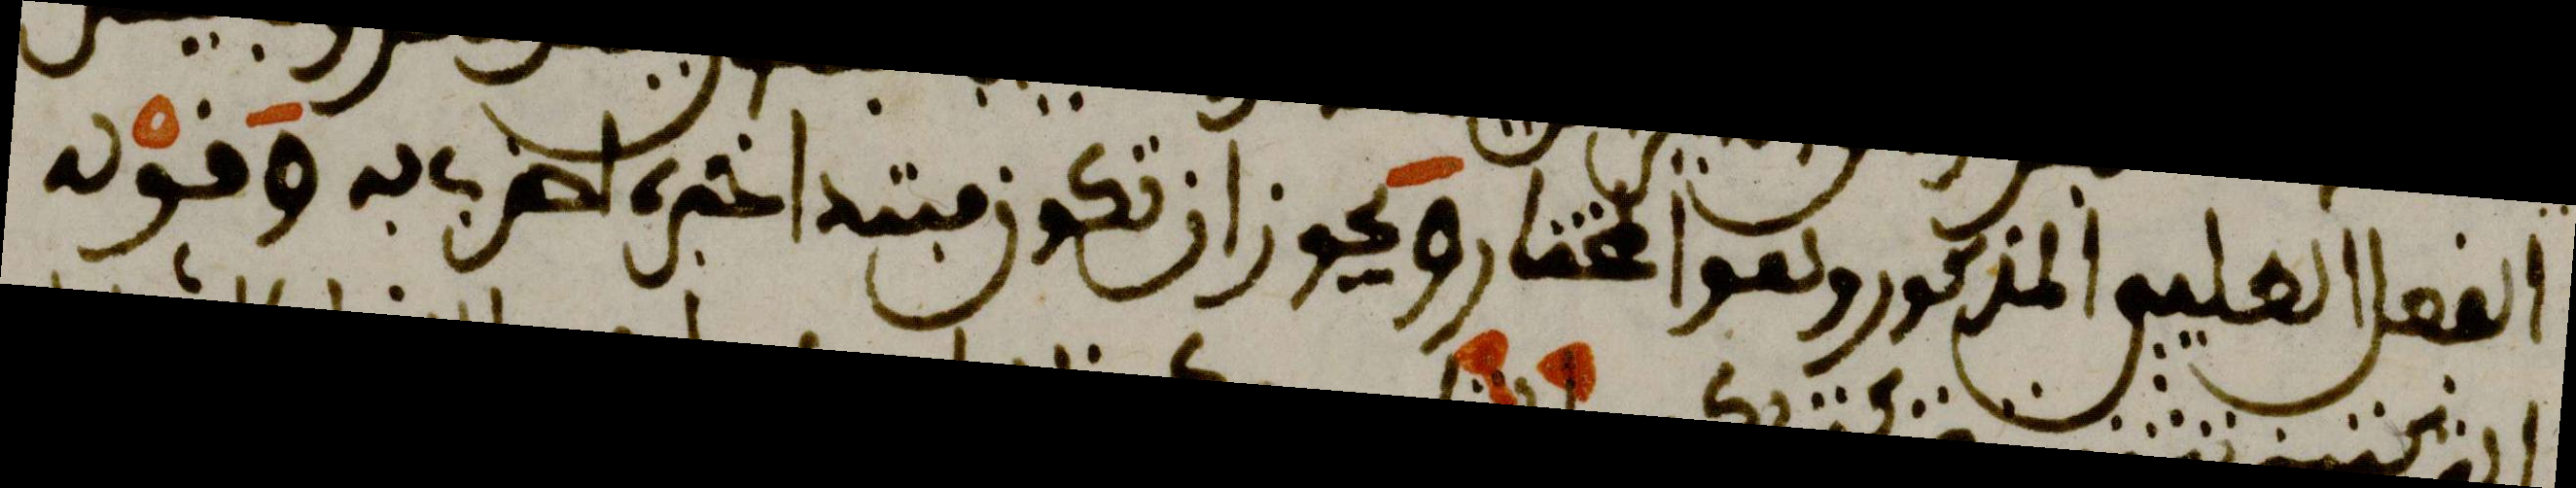الفعل الطلبي المذكور وهو المختار وَيجوز ان تكون مبتدا خبره اضربه وَقوْله
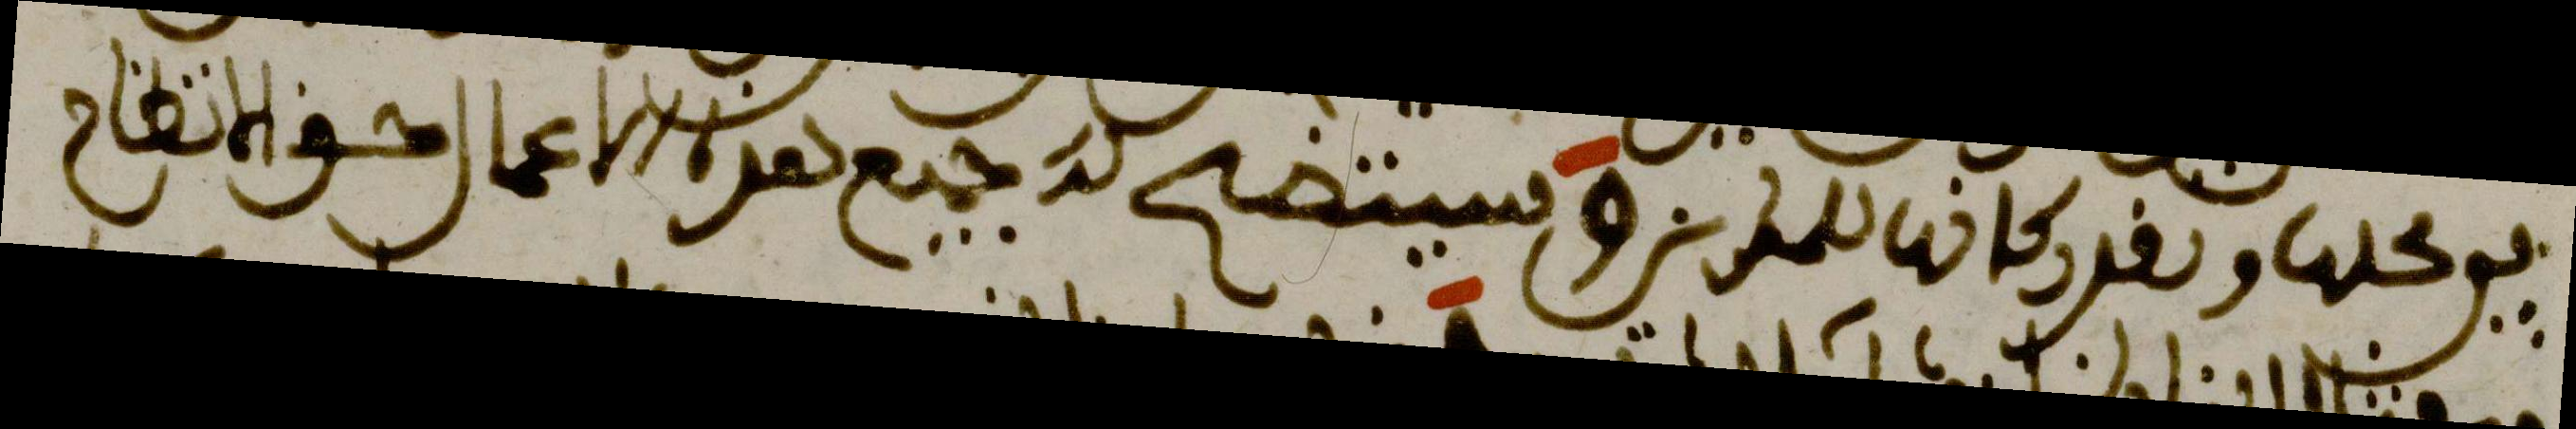في محلها وتقدر كانها للمدين وَسيتضح لك جميع هذا الاعمال حق الاتظاح
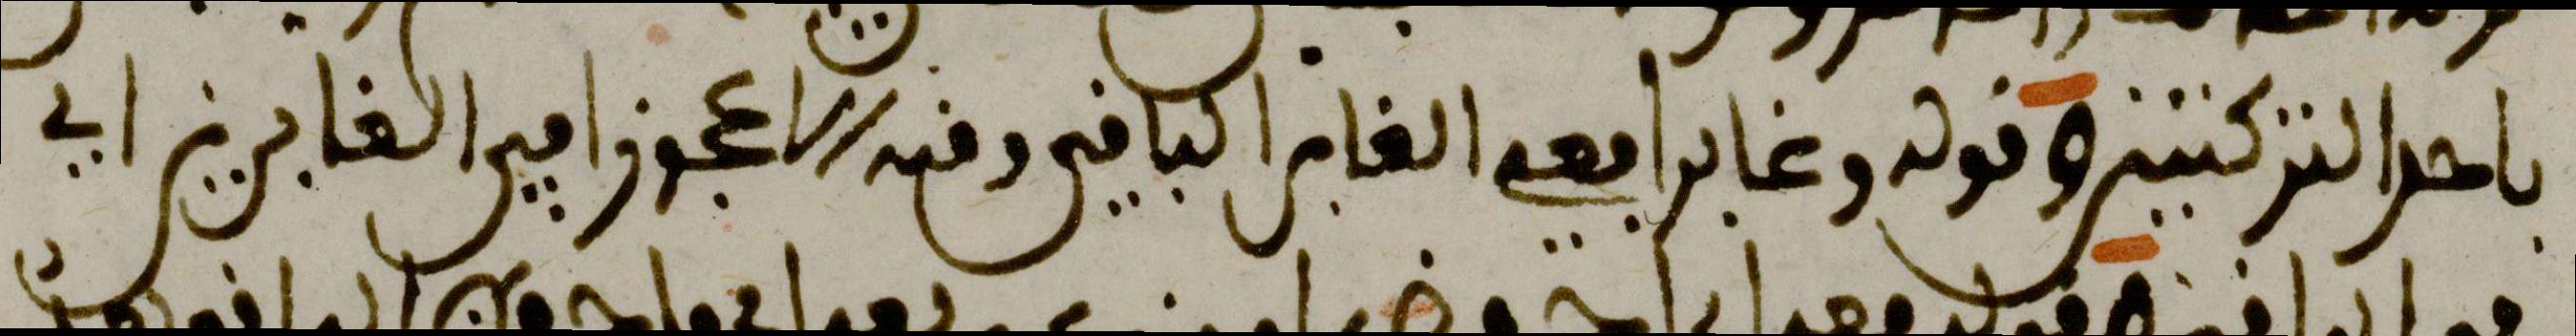باحدا التركتين وَقوله وغابر افعي الغابر الباقي ومنه الاعجوزا في الغابرين اي
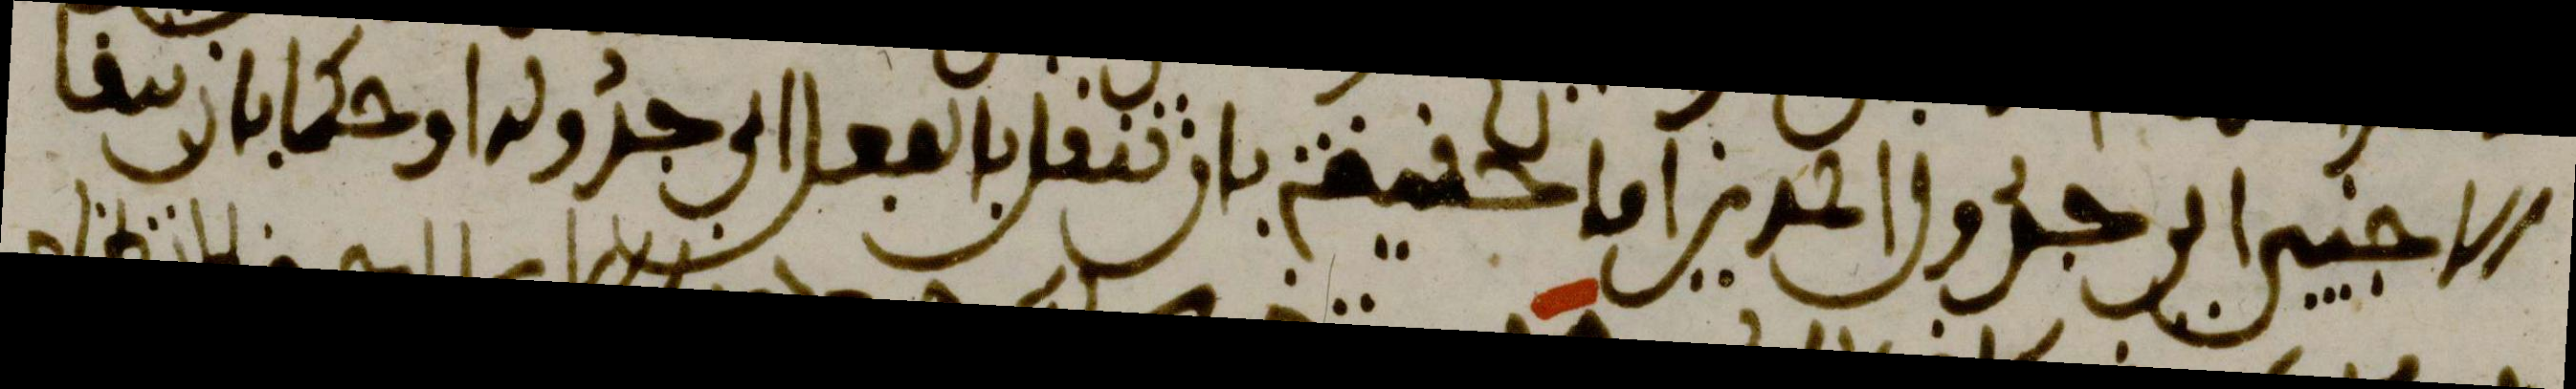الاجنبي الى جدول المدين اما حقيقة بان تنقل بالفعل الى جدوله او حكما بان تبقا
